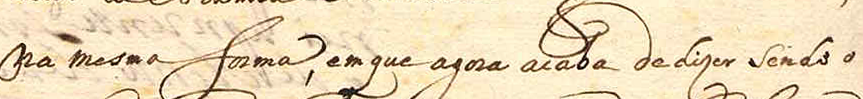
na mesma forma, em que agora acaba de dizer sendo o
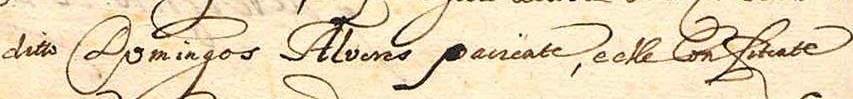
ditto Domingos Alveres paciente, e elle Confitente
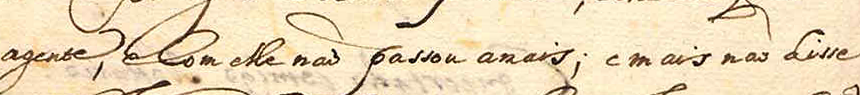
agente, e Com elle naõ passou a mais; e mais não disse
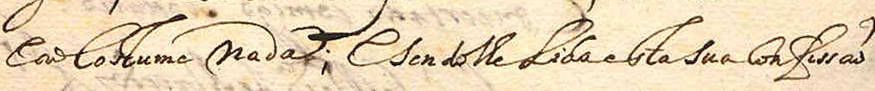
E ao Costume nada; E sendolhe Lida esta sua confissaõ
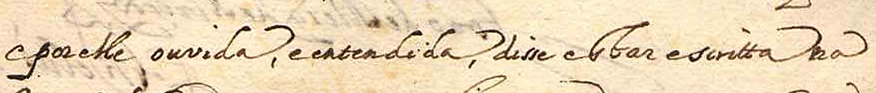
e por elle ouvida, e entendida, disse estar escritta na
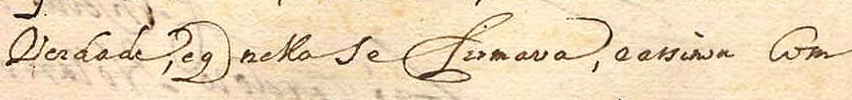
Verdade, e q̄ nella se firmava, e assinou Com
